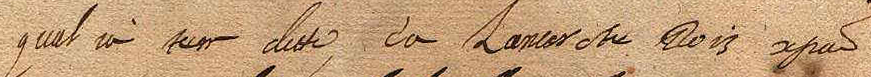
qual ia tem ditto do Lançarote Roiz xpaõ
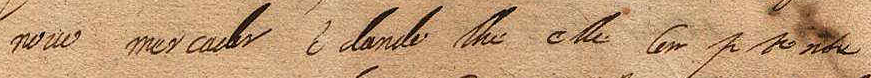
nouo mercador e dando lhe elle Confitente
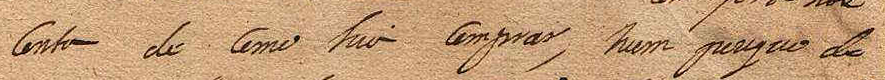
Conta de como hia comprar, hum pouquo de
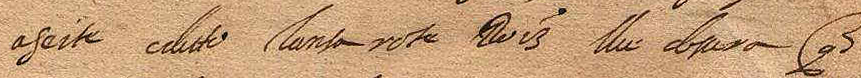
aseite o ditto lansarote Roiz̄ lhe dissera q̄
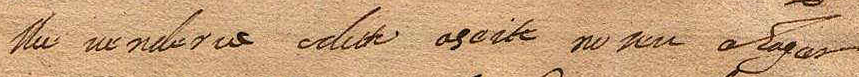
lhe uenderia o ditto aseite no seu alagar
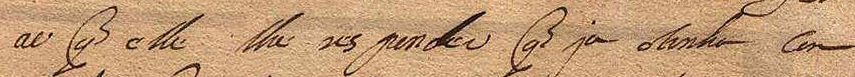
ao q̄ elle lhe respondeo q̄ ja o tinha con
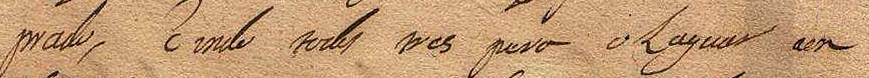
prado, e indo todos tres pera o Laguar aon
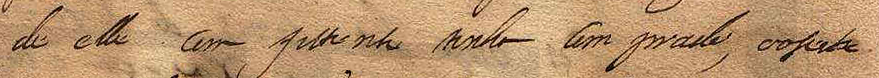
de elle comfittente tinha comprado, o aseite
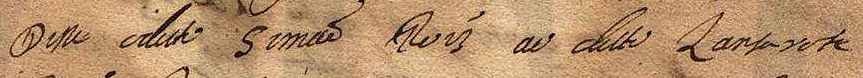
Disse o ditto Simão Roiz̄ ao ditto Lansarote
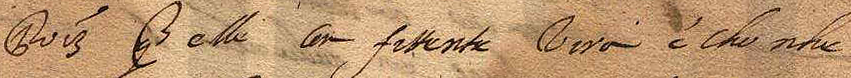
Roiz̄ q̄ elle confittente vira e chonhe
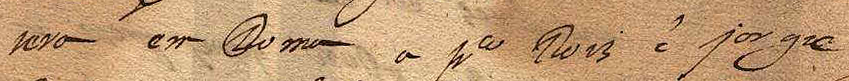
sera em Roma a frco Roiz e jorgie
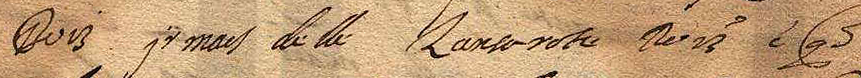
Roiz jrmaos delle Lansarote Roiz̄ e q̄
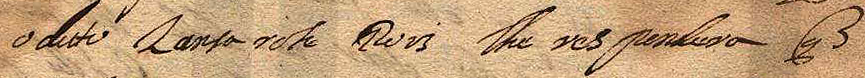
o ditto Lansarote Roiz lhe respondera q̄
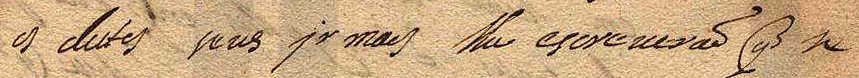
os dittos seus jrmaos lhe escreueraõ q̄ se
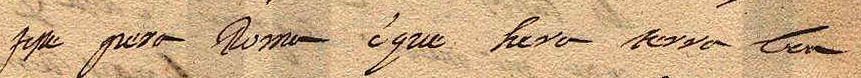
fosse pera Roma e que hera terra boa
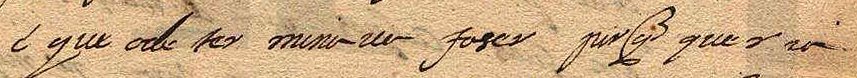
e que o determinaua faser porq̄ queria
